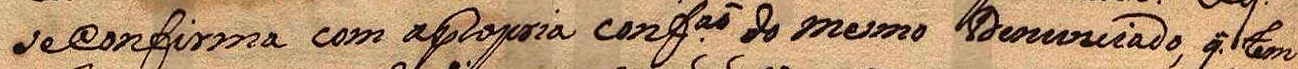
se confirma com a pRopria conf.aõ do mesmo Denunciado, q̄ tem
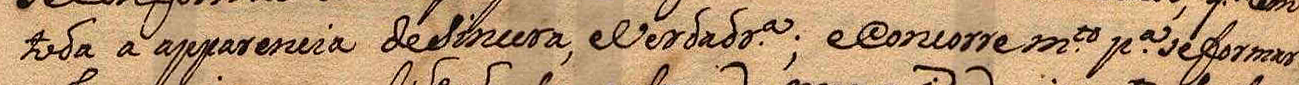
toda a apparencia de Sincera, e verdadr.a; e concorre m.to p.a se formar
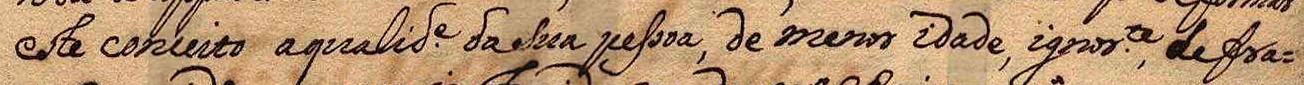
este conceito a qualid.e da sua pessoa, de menor idade, ignor.te, de fra
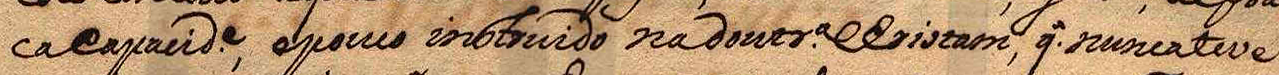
ca capacid.e, e pouco instruido na doutr.a christam, q̄ nunca teve
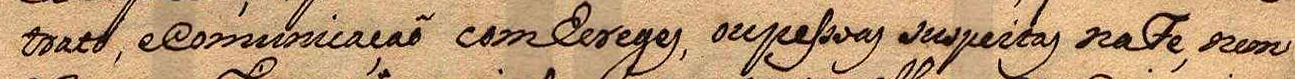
trato, e comunicaçaõ com hereges, ou pessoas suspeitas na Fe, nem
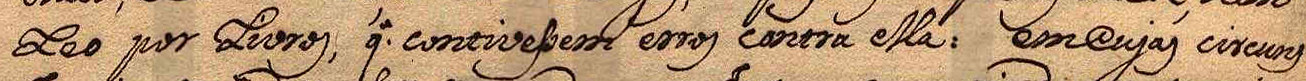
Leo por Livros, q̄ contivessem erros contra ella: em cujas circuns
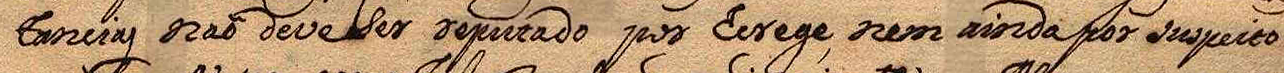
tancias naõ deve ser reputado por herege, nem ainda por suspeito
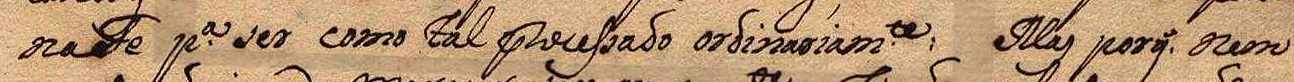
na Fe p.a ser como tal processado ordinariam.te; Mas porq̄ nem
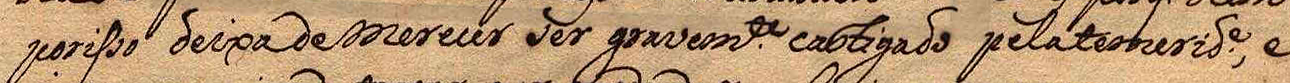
por isso deixa de merecer ser gravem.te castigado pela temerid.e, e
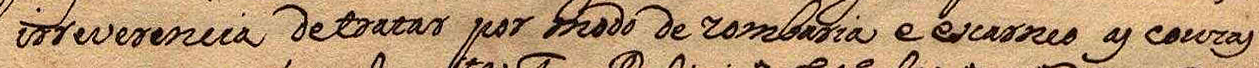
irreverencia de tratar por modo de zombaria e escarneo as couzas
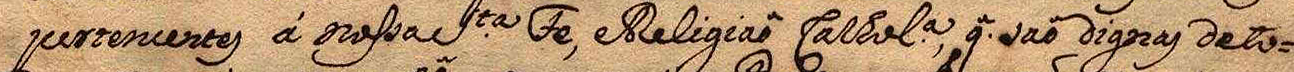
pertencentes á nossa S.ta Fe, e Religiaõ Cathol.a, q̄ saõ dignas de to
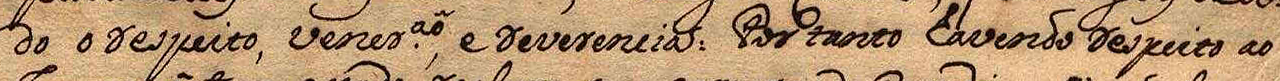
do o respeito, vener.aõ, e reverencia: Portanto havendo respeito ao
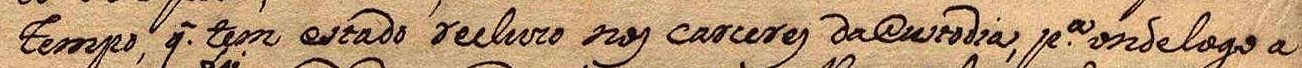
tempo, q̄ tem estado recluzo nos carceres da Custodia, p.a onde logo a
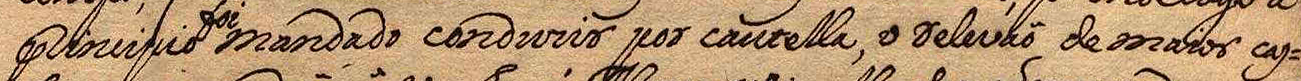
pRincipio foi mandado conduzir por cautella, o relevaõ de maior cas
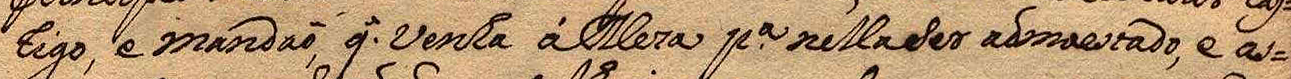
tigo, e mandaõ q̄ venha á Meza p.a nella ser admoestado, e as
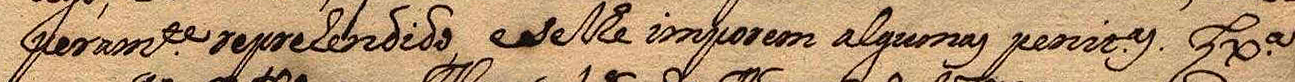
peram.te reprehendido, e se lhe imporem algumas penit.as. Lx.a
